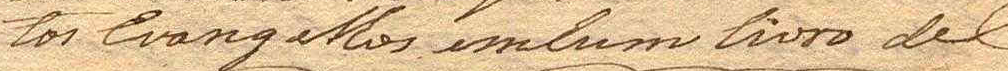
tos Evangelhos em hum livro del
